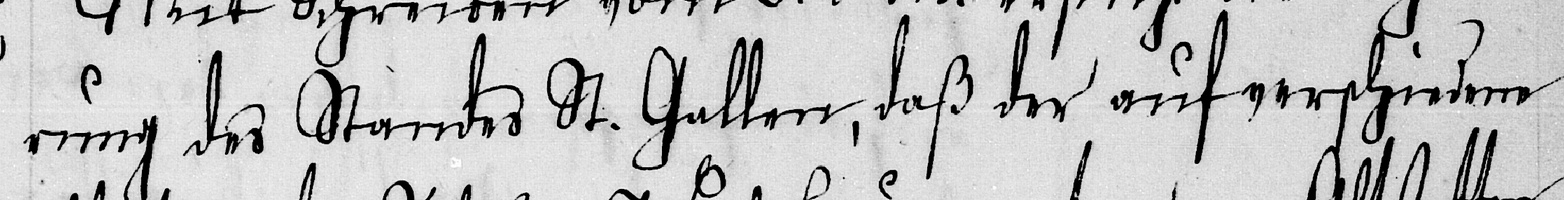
rung des Standes St. Gallen, daß der auf verschiedene
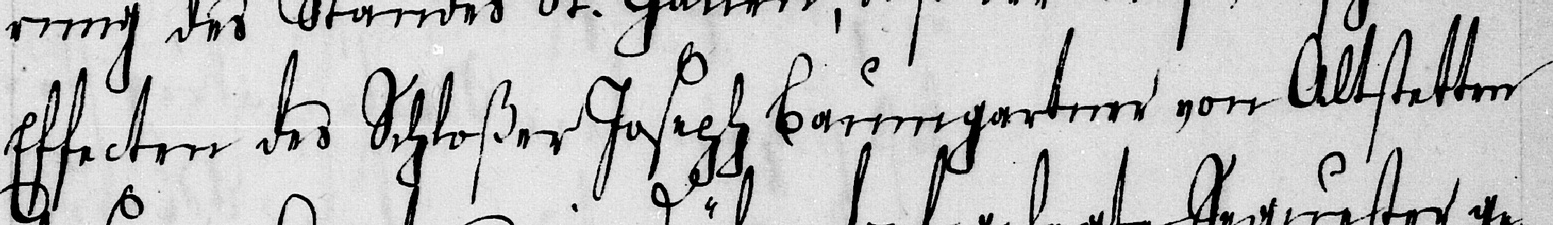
ffecten des Schloßer Joseph Baumgartner von Altstetten
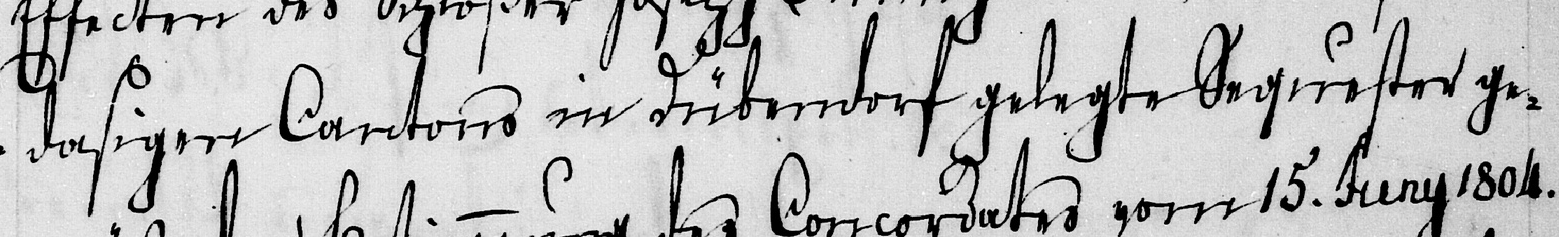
dasigen Cantons in Dübendorf gelegte Sequester ge¬
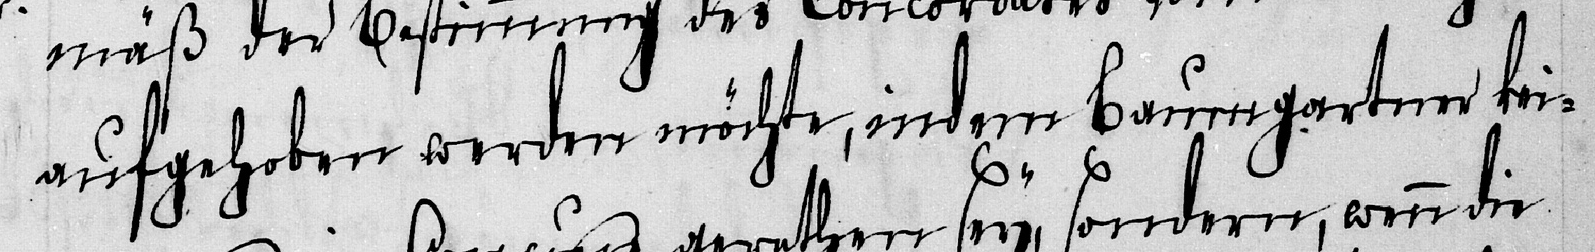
aufgehoben werden möchte, indem Baumgartner kei¬
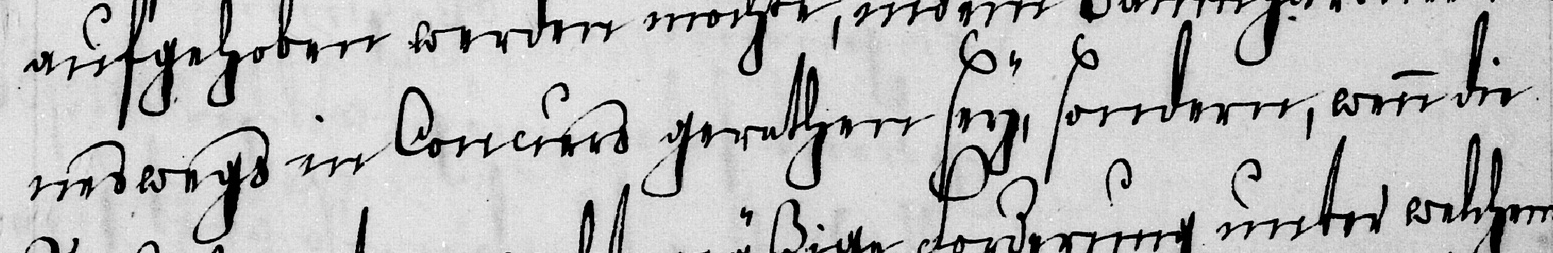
neswegs in Concurs gerathen sey, sondern, wenn die
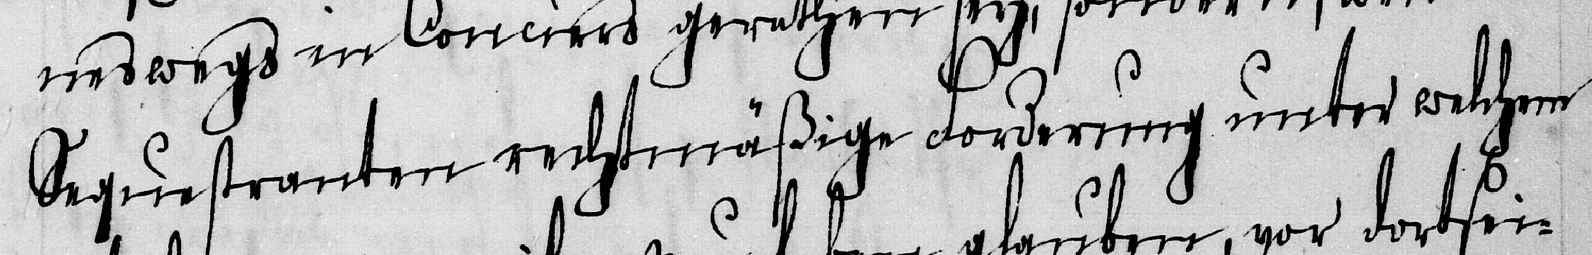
Sequestranten rechtmäßige Forderung unter welchem
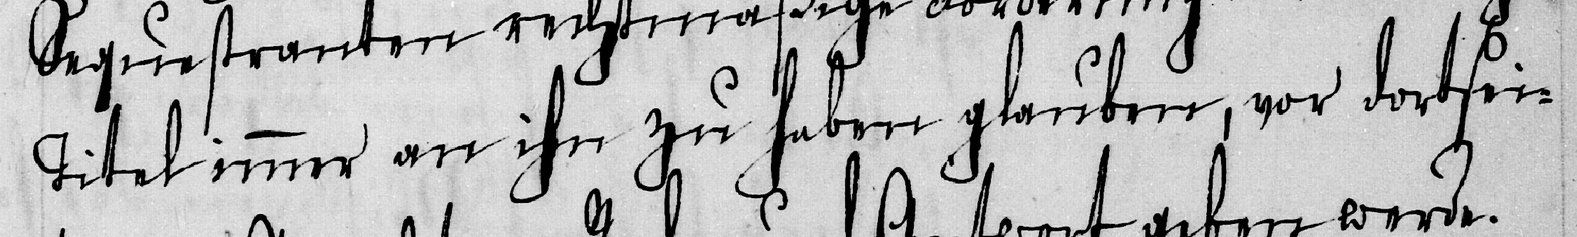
Titel immer an ihn zu haben glauben, vor dortsei¬
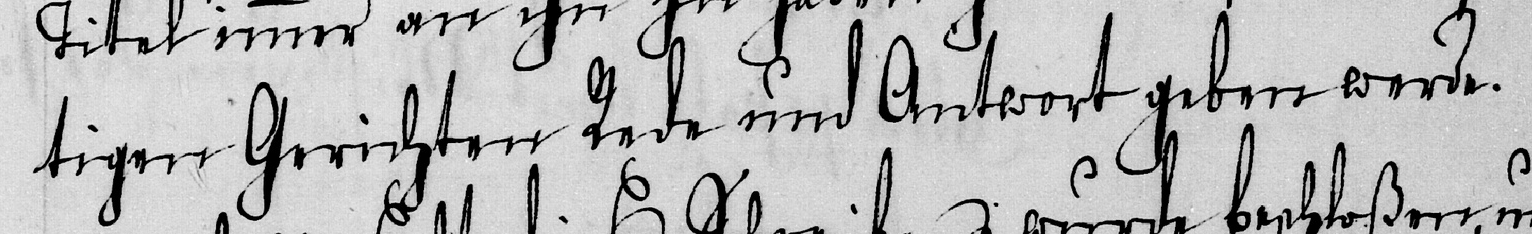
tigen Gerichten Rede und Antwort geben werde.
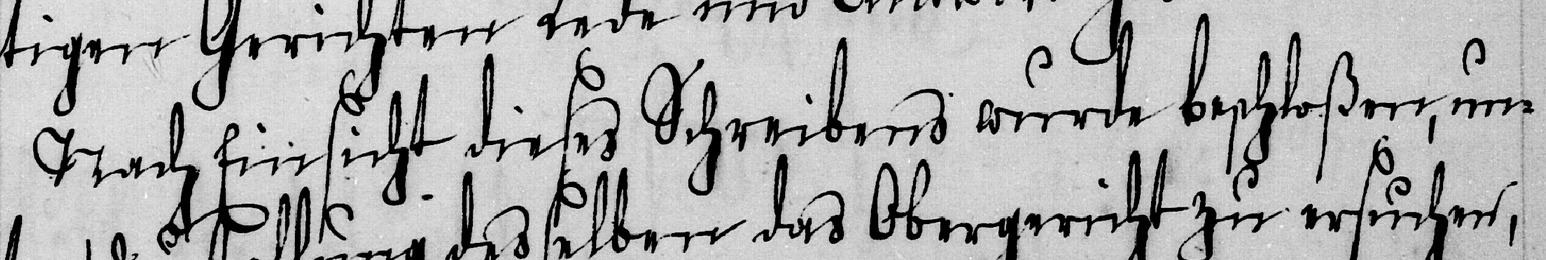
Nach Einsicht dieses Schreibens wurde beschloßen, un¬
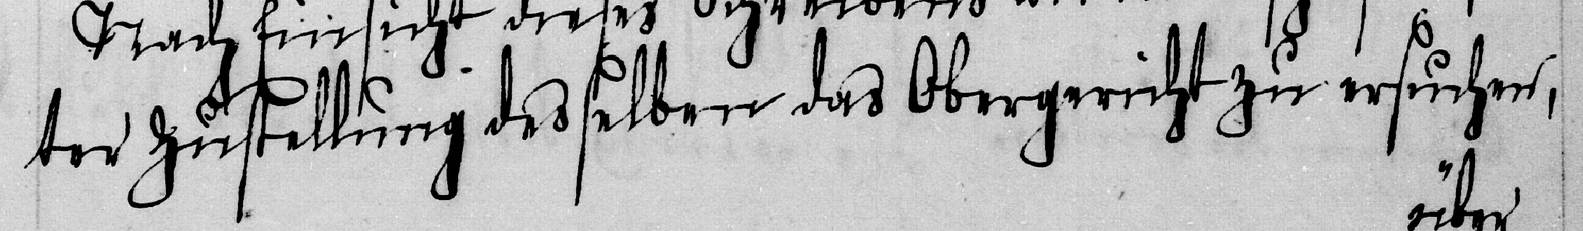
ter Zustellung desselben das Obergericht zu ersuchen,
